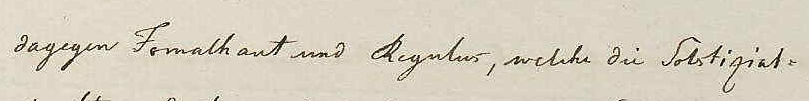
dagegen Fomalhaut und Regulus, welche die Solstizial-
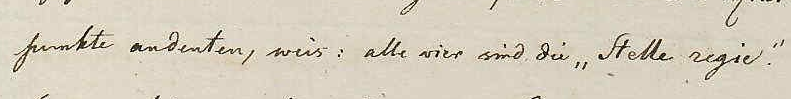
punkte andeuten, weis: alle vier sind die „Stelle regie”.
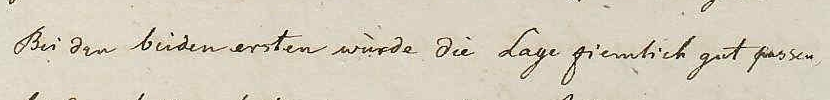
Bei den beiden ersten würde die Lage ziemlich gut passen,
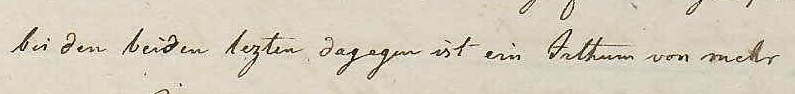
bei den beiden lezten dagegen ist ein Irthum von mehr
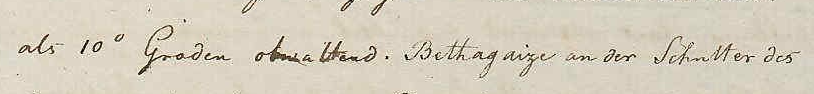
als 10° Graden obwaltend. Bethagaize an der Schulter des
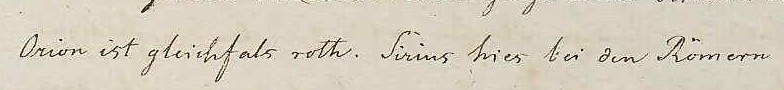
Orion ist gleichfals roth. Sirius hies bei den Römern
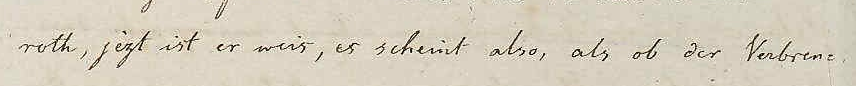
roth, jezt ist er weis, es scheint also, als ob der Verbren-
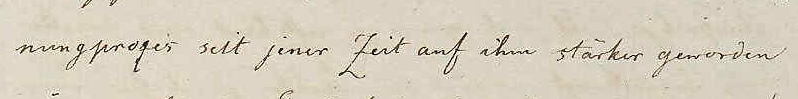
nungsprozes seit jener Zeit auf ihm stärker geworden
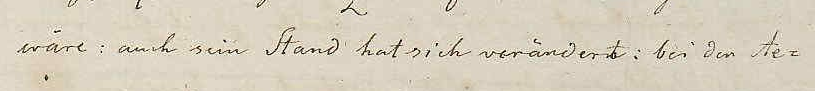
wäre: auch sein Stand hat sich verändernt: bei den Ae-
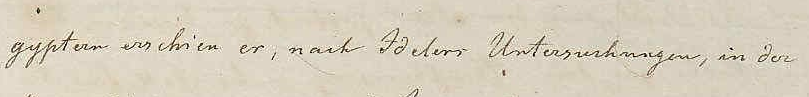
gyptern erschien er, nach Idelers Untersuchungen, in der
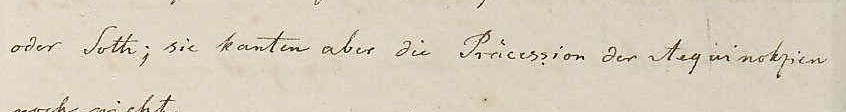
oder Soth; sie kanten aber die Präcession der Aequinokzien
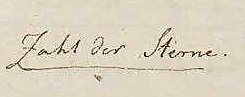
Zahl der Sterne.
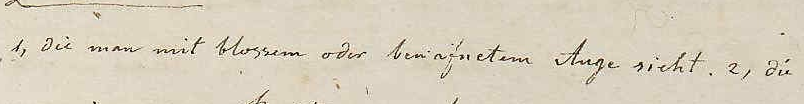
1, die man mit blossem oder bewafnetem Auge sieht. 2, die
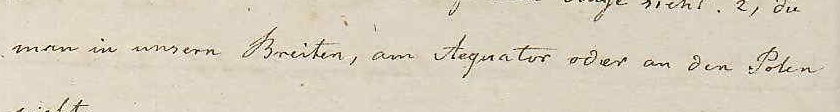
man in unsern Breiten, am Aequator oder an den Polen
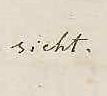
gerechnet,
